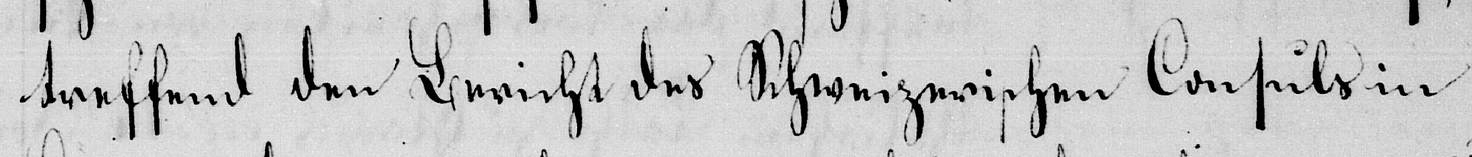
treffend den Bericht des Schweizerischen Consuls in
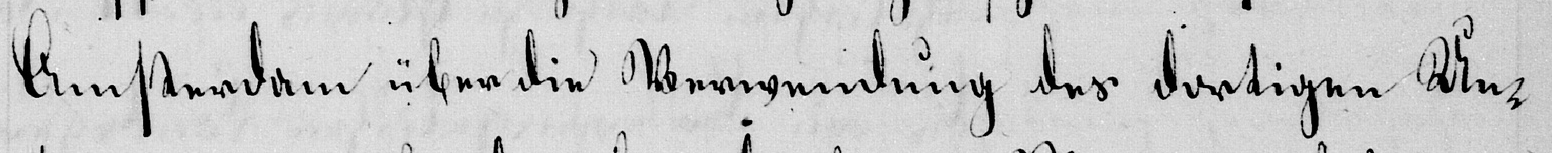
Amsterdam über die Verwendung des dortigen Un¬
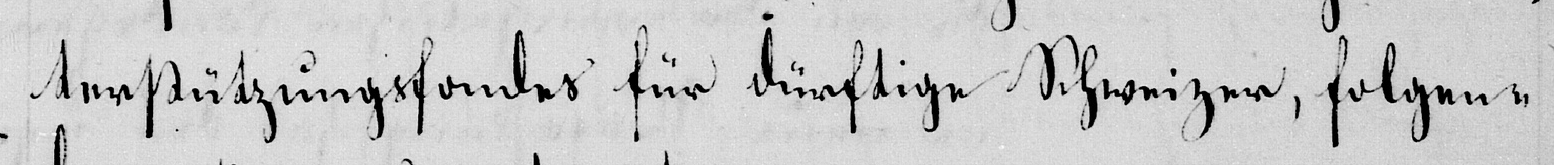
terstützungsfondes für dürftige Schweizer, folgen¬
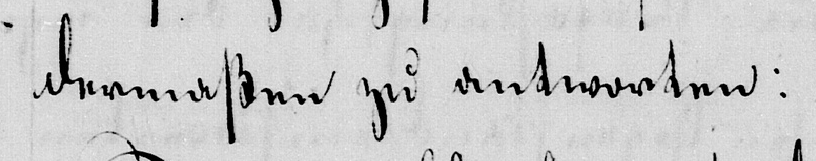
dermaßen zu antworten:
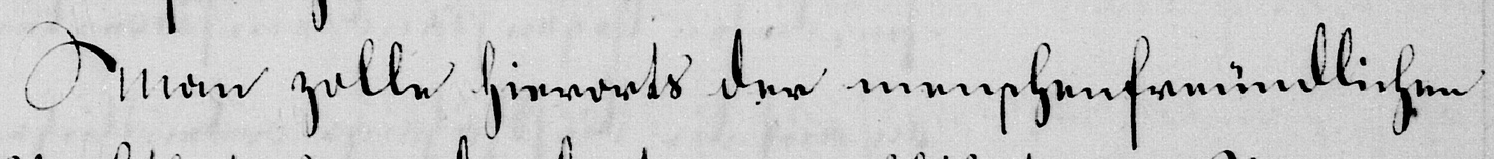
Man zolle hierorts der menschenfreundlichen
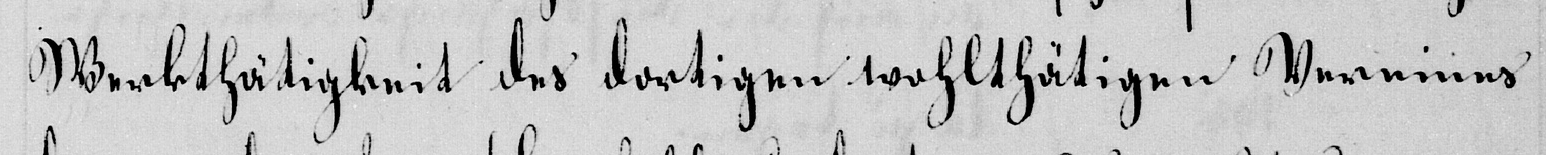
Werkthätigkeit des dortigen wohlthätigen Vereines
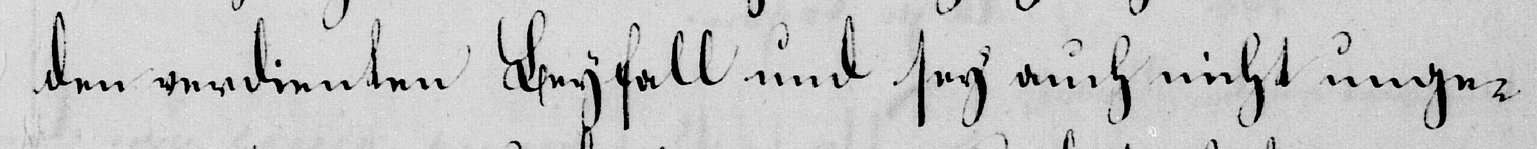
den verdienten Beyfall und sey auch nicht unge¬
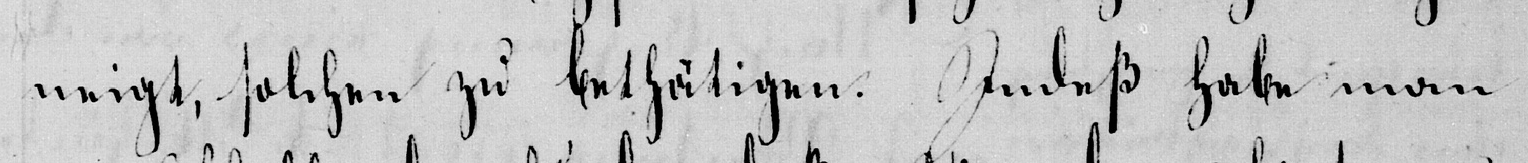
neigt, solchen zu bethätigen. Indeß habe man
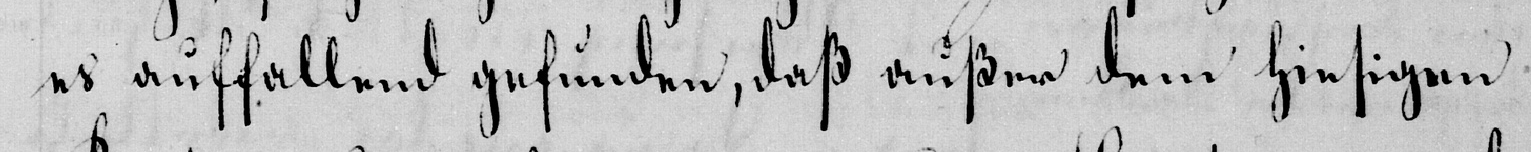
es auffallend gefunden, daß außer dem hiesigen
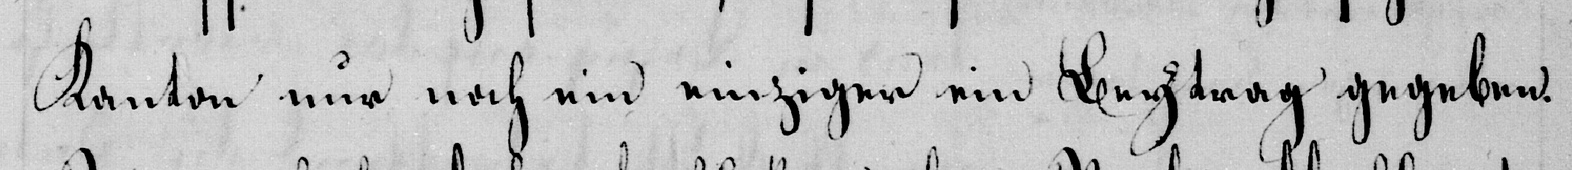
Kanton nur noch ein einziger ein Beytrag gegeben.
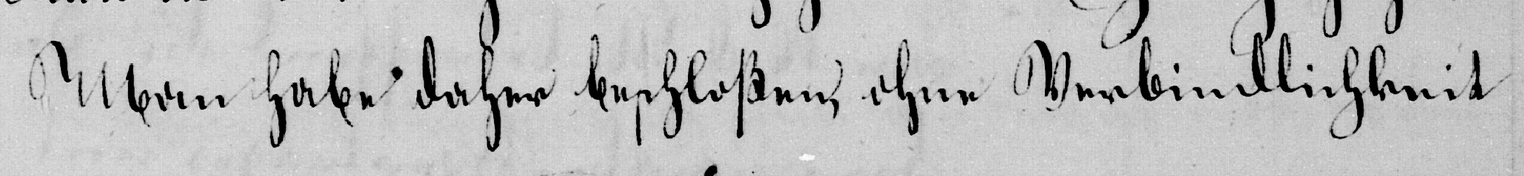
Man habe daher beschloßen, ohne Verbindlichkeit
